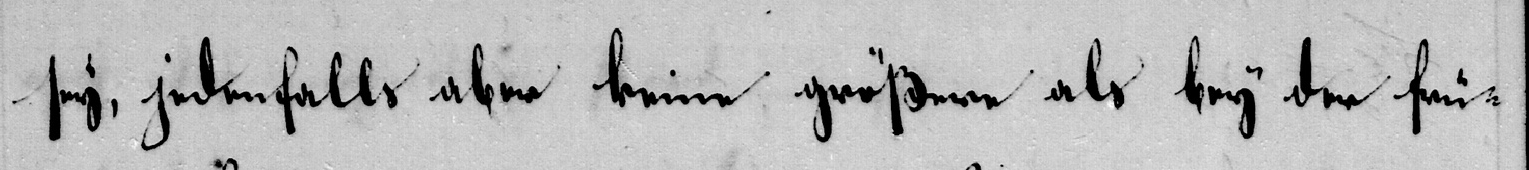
sey, jedenfalls aber keine größere als bey der frü¬
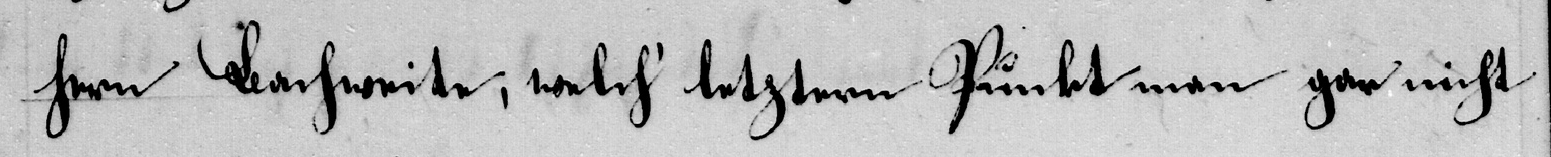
hern Bachweite, welch’ letztern Punkt man gar nicht
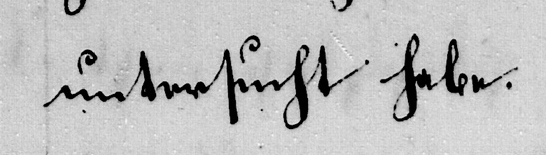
untersucht habe.
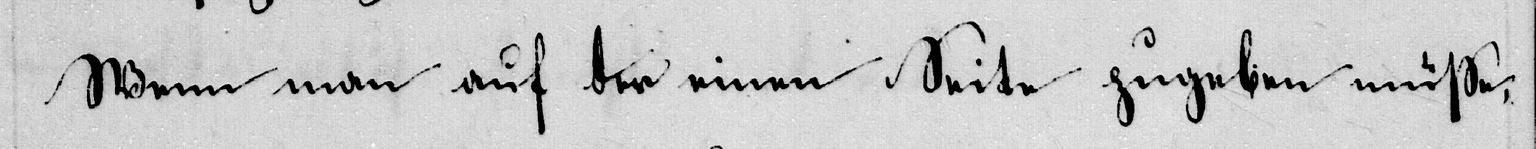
Wenn man auf der einen Seite zugeben müße,
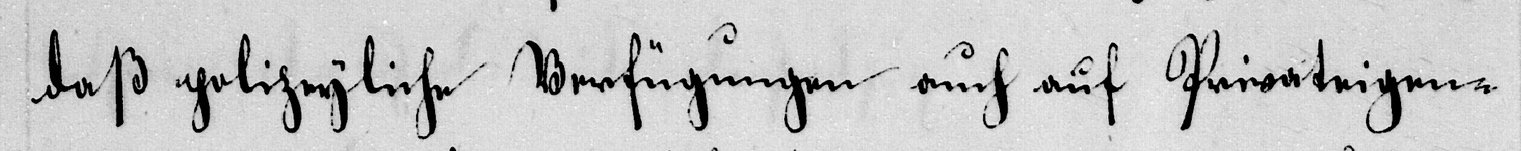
daß polizeyliche Verfügungen auch auf Privateigen¬
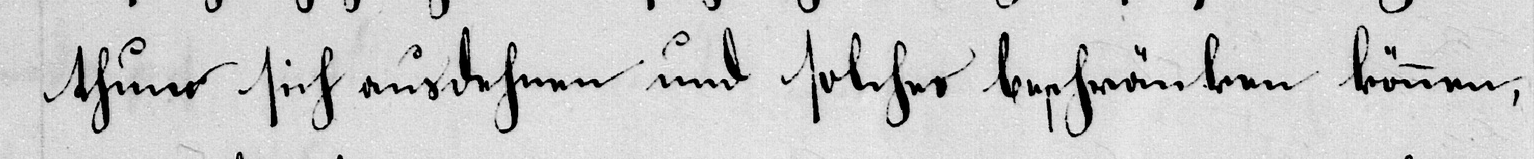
thum sich ausdehnen und solches beschränken können,
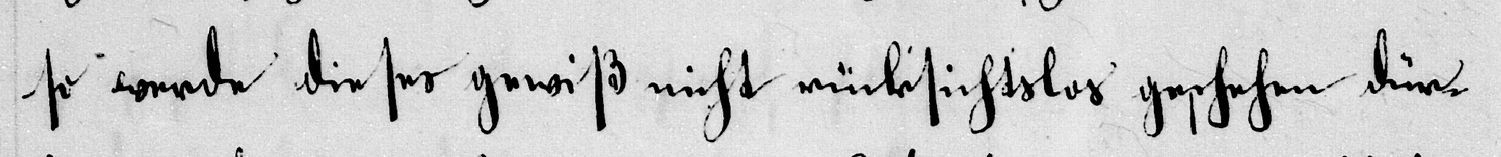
so werde dieses gewiß nicht rücksichtslos geschehen dür¬
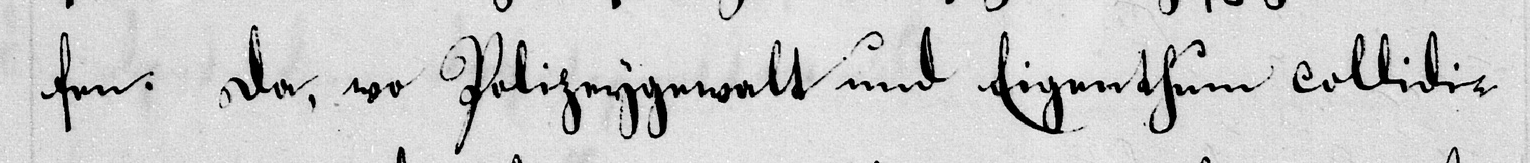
fen. Da, wo Polizeygewalt und Eigenthum collidi¬
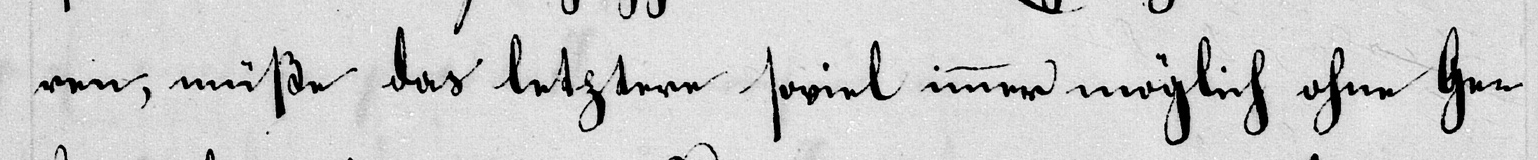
ren, müße das letztere soviel immer möglich ohne Ge¬
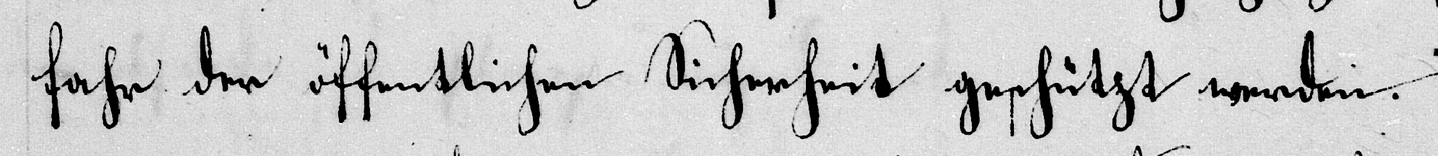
fahr der öffentlichen Sicherheit geschützt werden.
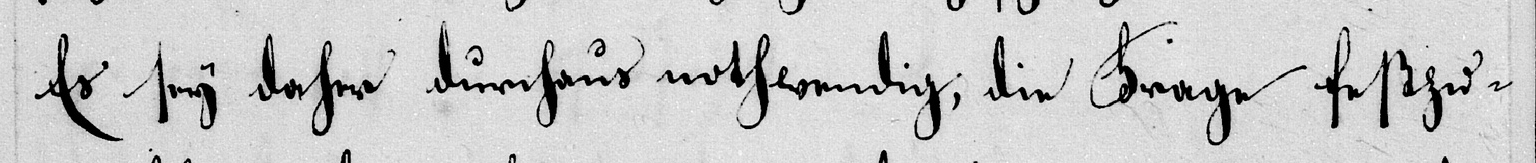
Es sey daher durchaus nothwendig, die Frage festzu¬
